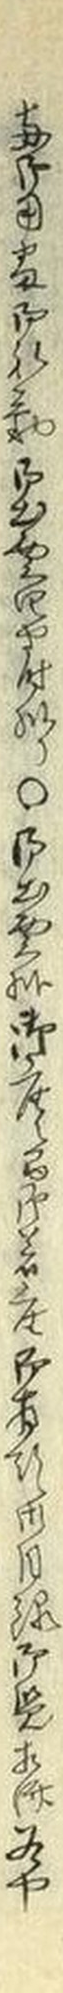両御用番御礼勤御出殿四半時掛り〇御出殿掛御座之間御着座御拝領御目録御覧相済谷中
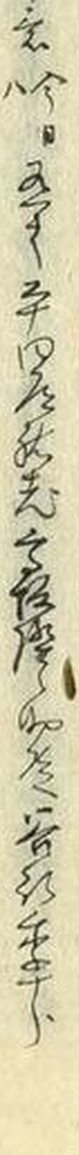ハ有之平田道祐老高坂隆之助殿谷行季一郎
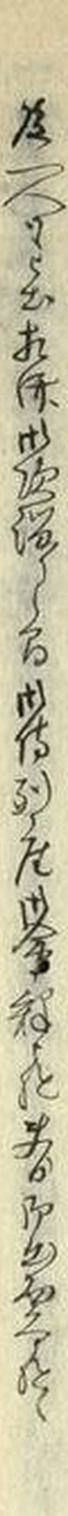殿一人ツヽ被出相済御次溜り之間御侍列座御会釈被遊夫ゟ御出殿被遊候
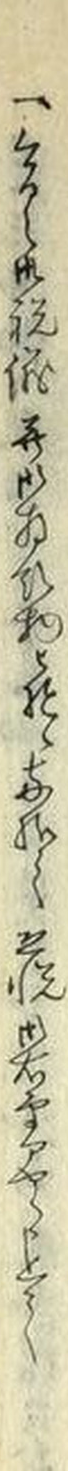一今日之御祝儀幷御拝領物被遊候両様之恐悦御右筆部屋へ申上之
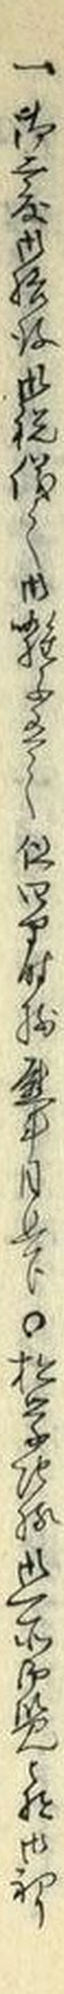一御二度御膳後御祝儀之御囃子有之但四半時揃熨斗目上下〇松栄院様御一所御覧被遊御初り
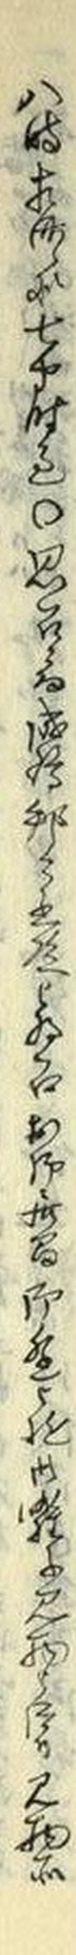八時相済候処七半時過〇思召ニ而成嶋邦之丞殿被為召於御居間御逢被遊御囃子見物被仰付見物所
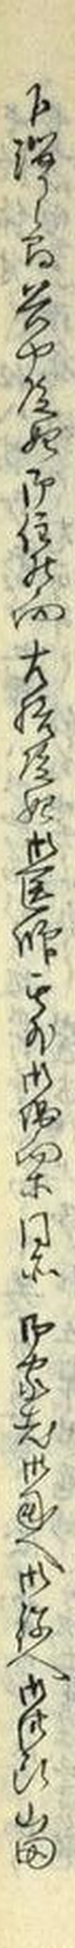下溜り之間谷中殿始御住居向左膳殿始御医師其外御側向等同所御家老御用人御役人御供頭山田
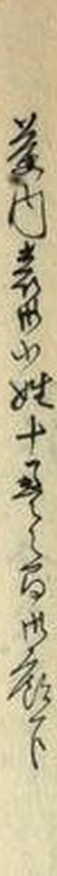藤内表御小姓十畳之間御廊下
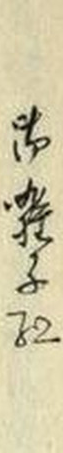御囃子組
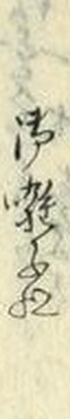御囃子組
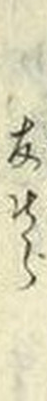亀次郎
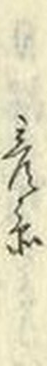久兵衛
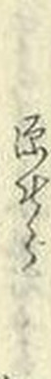源次郎
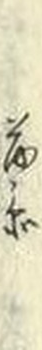久兵衛
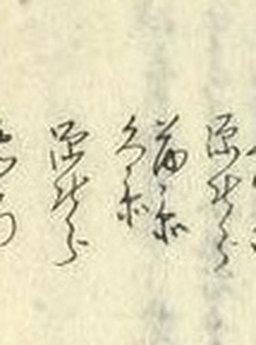久兵衛
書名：少傅日録抄（斉善付側向頭取日記、在府）
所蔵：福井県文書館 Fukui Prefectural Archives
